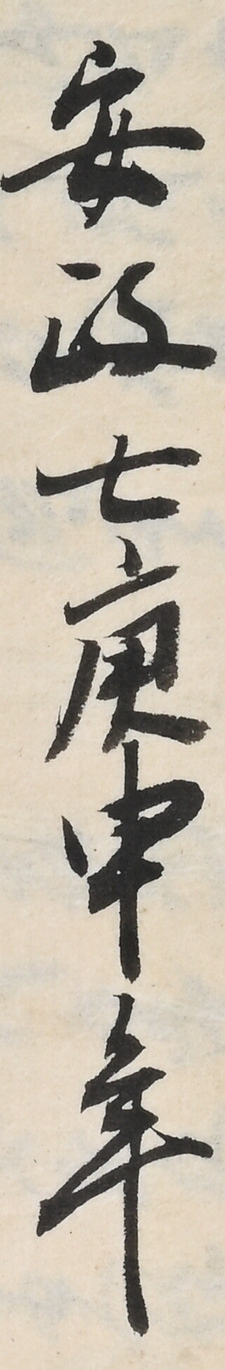安政七庚申年
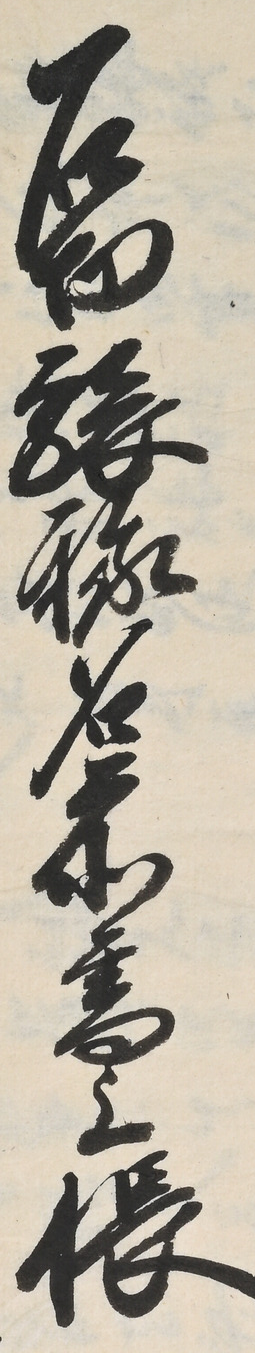石切旅稼名前書上帳

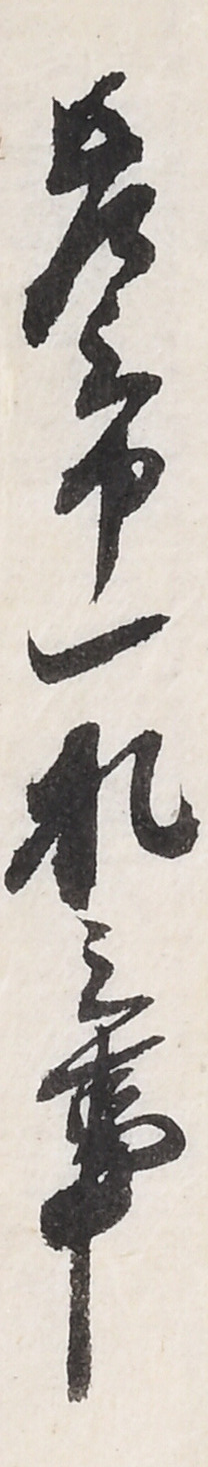差上申一札之事
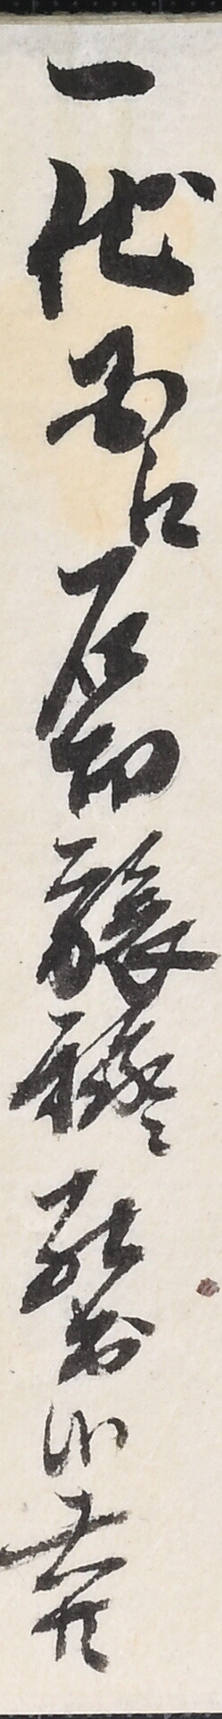一他国え石切旅稼ニ罷出候者共
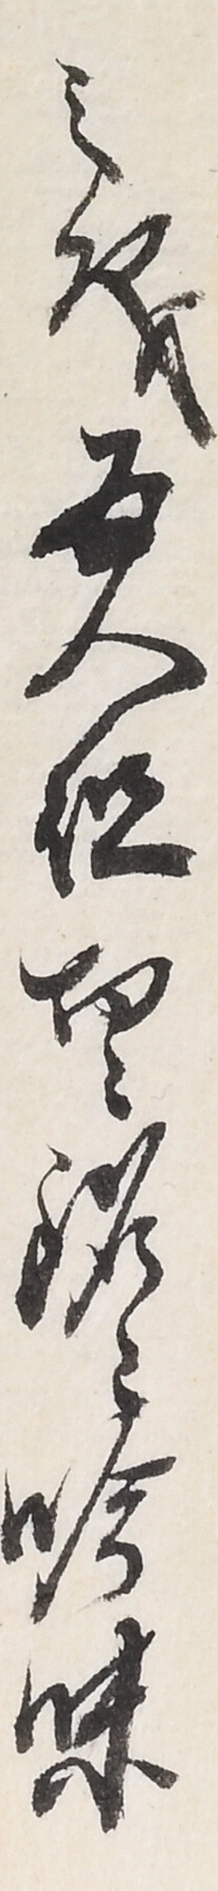之儀五人組切々銘々吟味
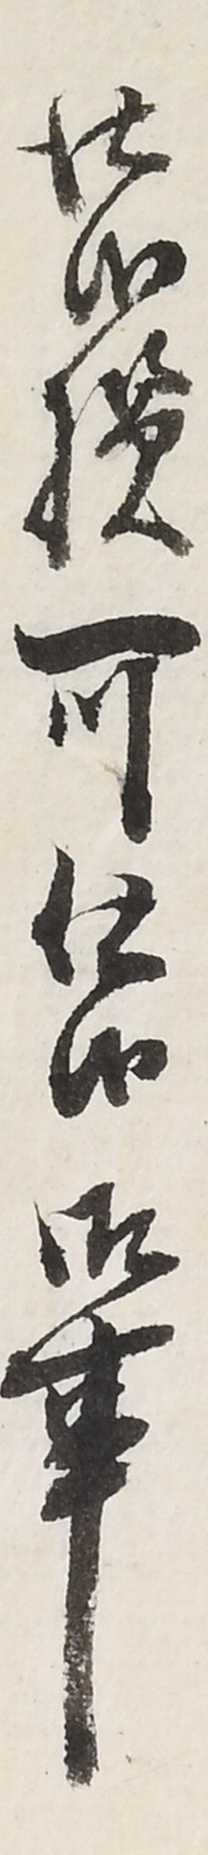仕候様可仕候御事
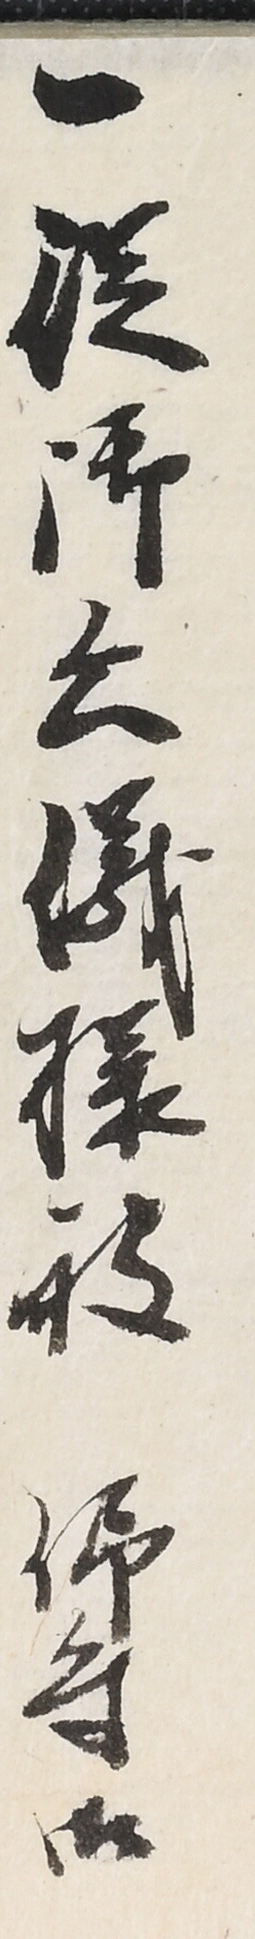一従御公儀様被仰付御
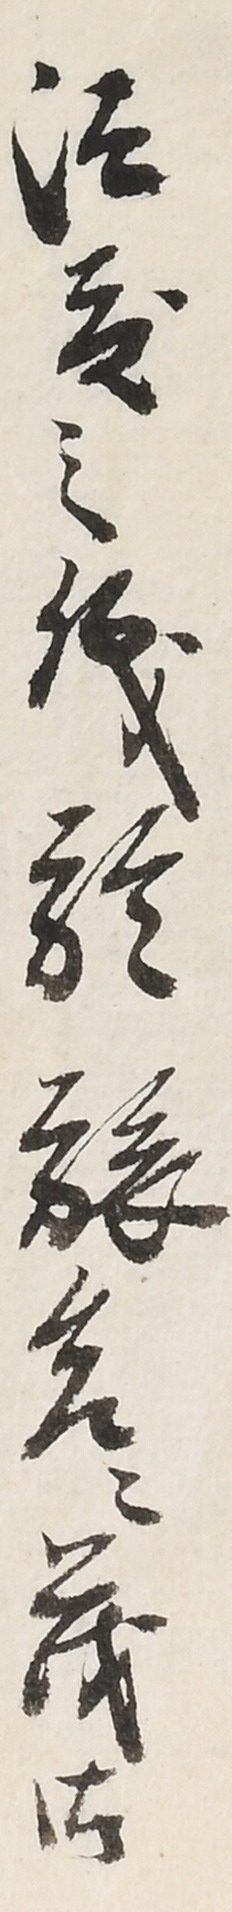法度之儀於旅先ニも御
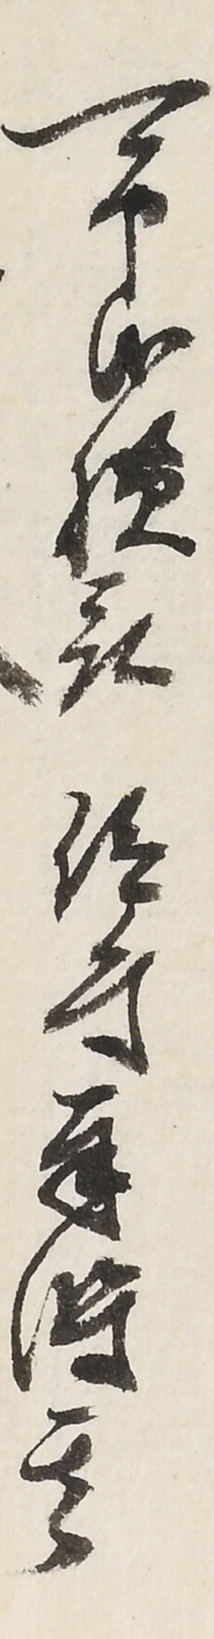可申候様被仰付奉得其
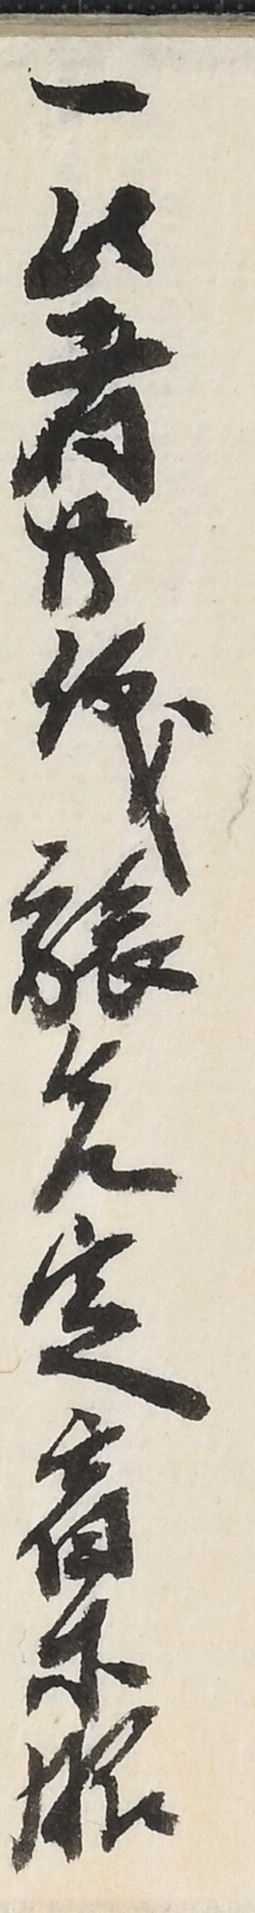一此者共儀旅先定宿等脇
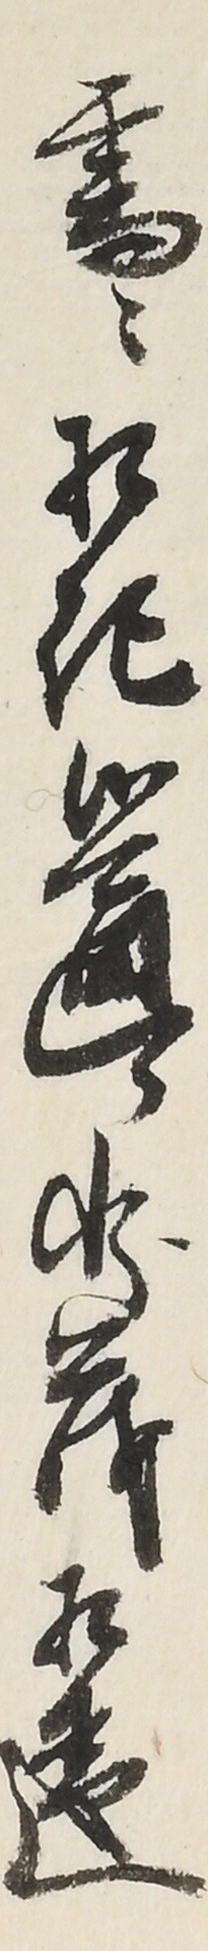書ニ相記候通り少も相違
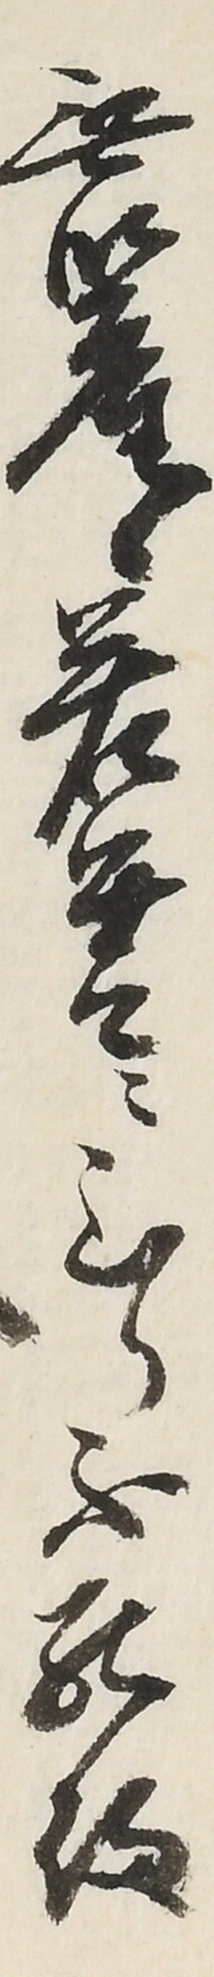無御座候若暮ニ至り不罷帰
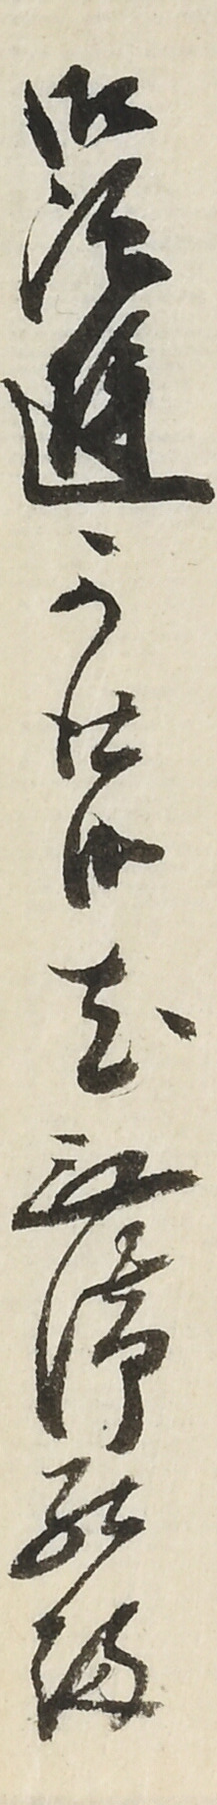御注進可仕候尤無滞罷帰
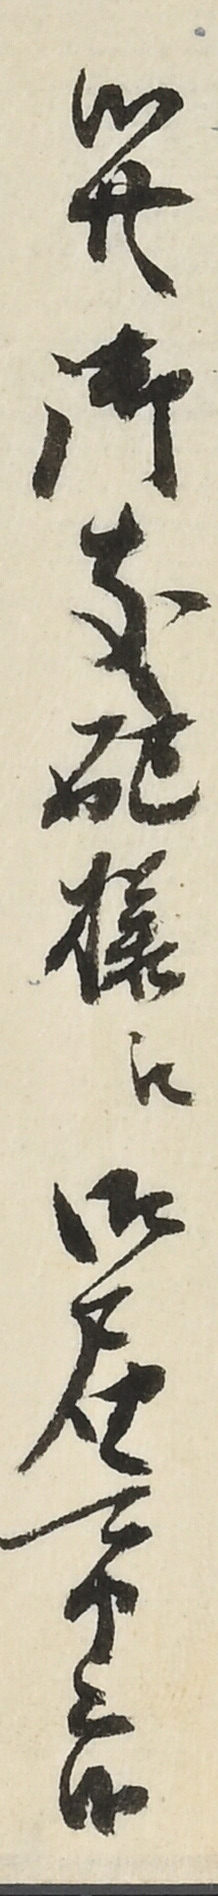候共御支配様え御届可申上候
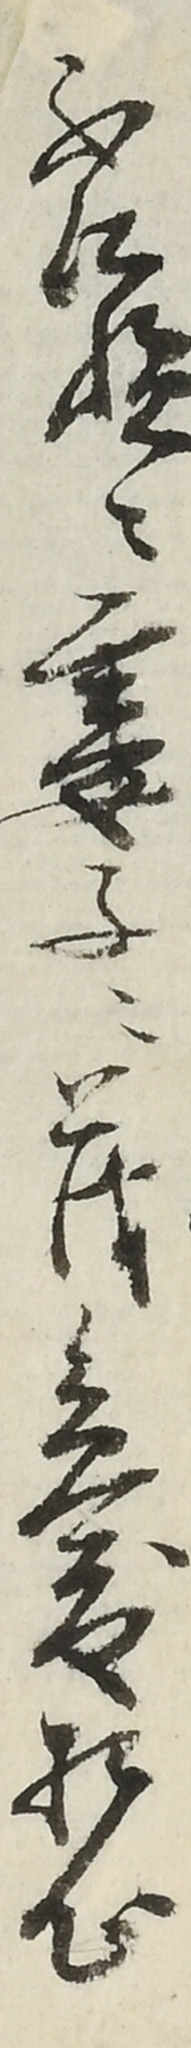不仕様ニ妻子ニも急度相心
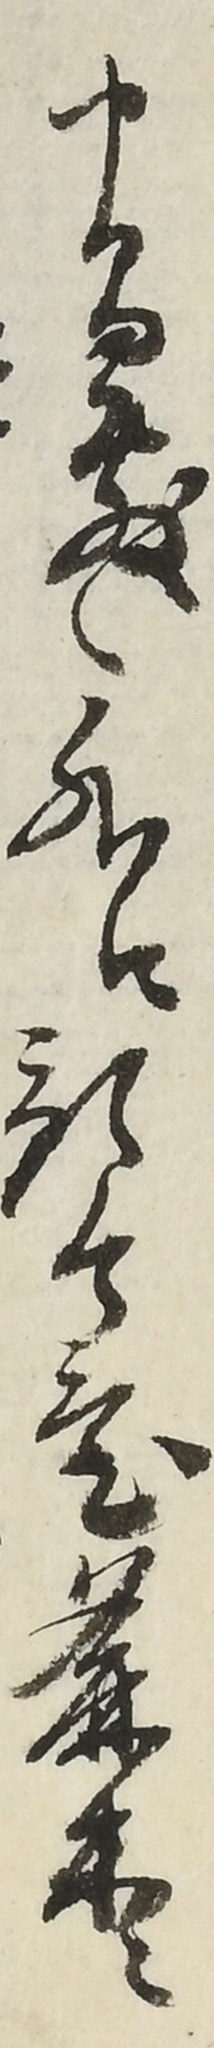申間敷候外え預ケ置麁末ニ
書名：安政七庚申年二月石切旅稼名前書上帳
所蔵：伊那市立高遠町図書館・合同会社AMANE
